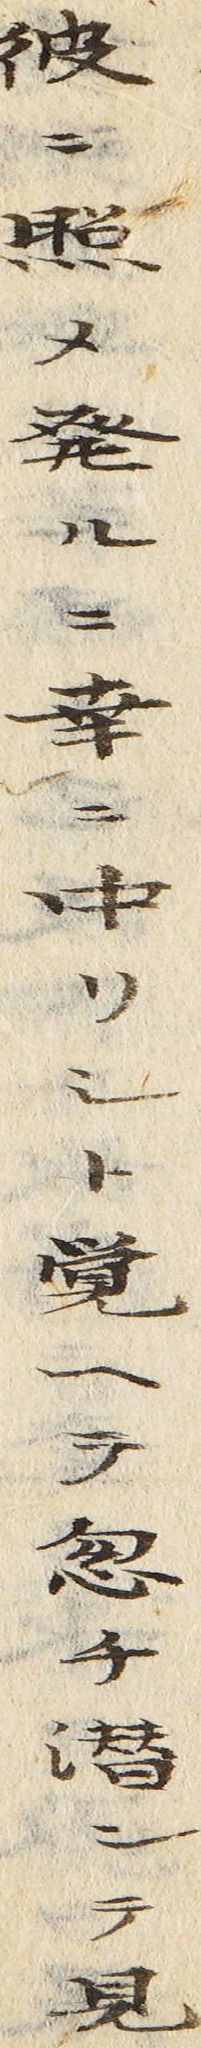彼ニ照メ発ルニ幸ニ中リシト覚ヘテ忽チ潜ンテ見
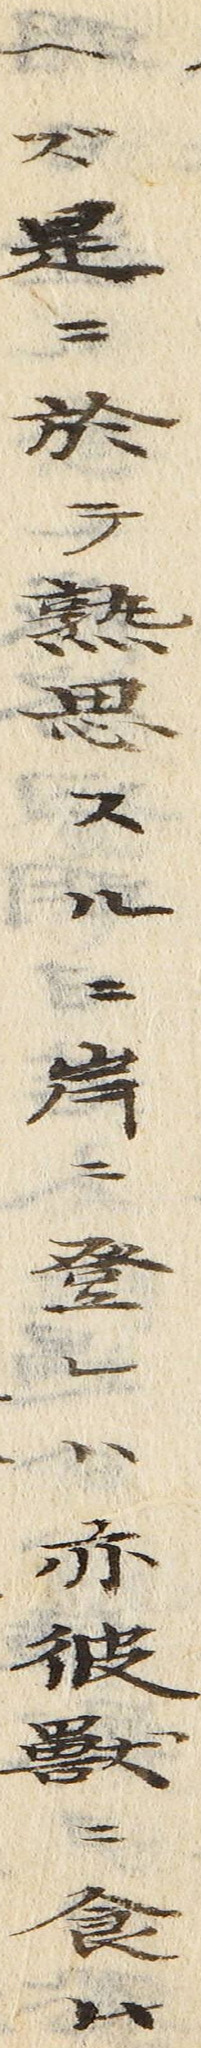ヘズ是ニ於テ熟思スルニ岸ニ登レハ亦彼獣ニ食ハ
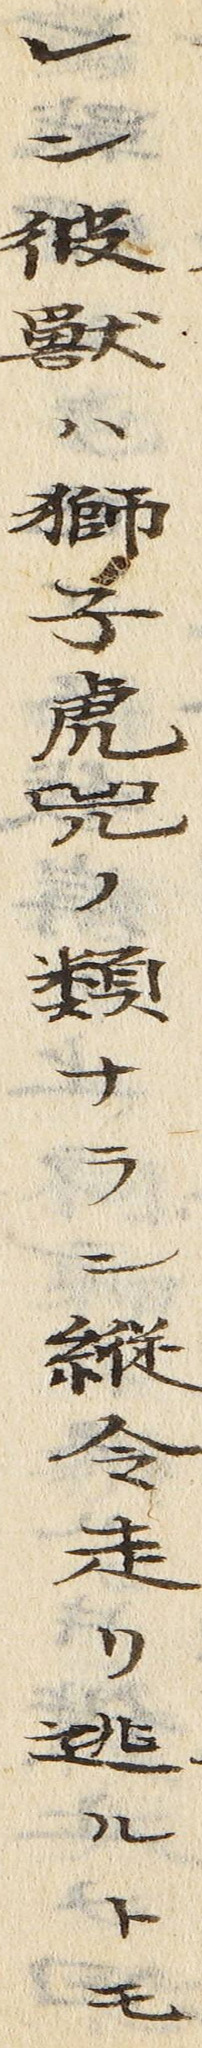レン彼獣ハ獅子虎兕ノ類ナラン縦令走リ逃ルトモ
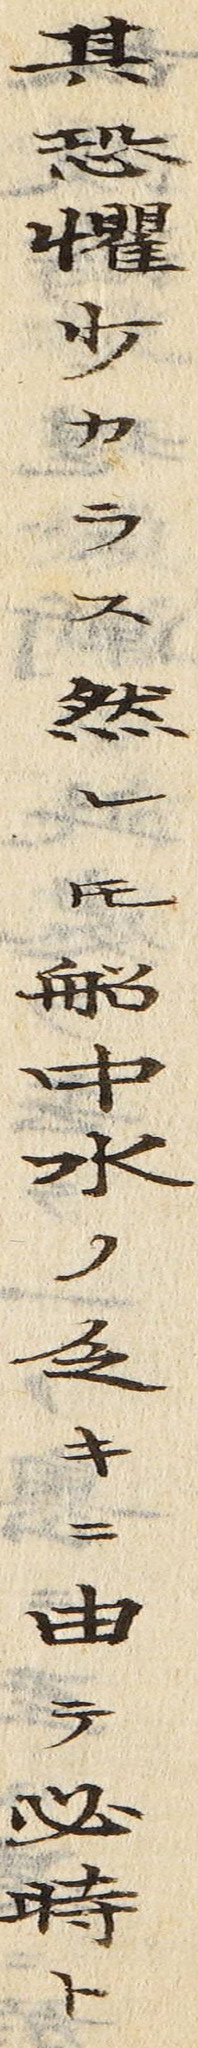其恐懼少カラス然レトモ船中水ノ乏キニ由テ必時ト
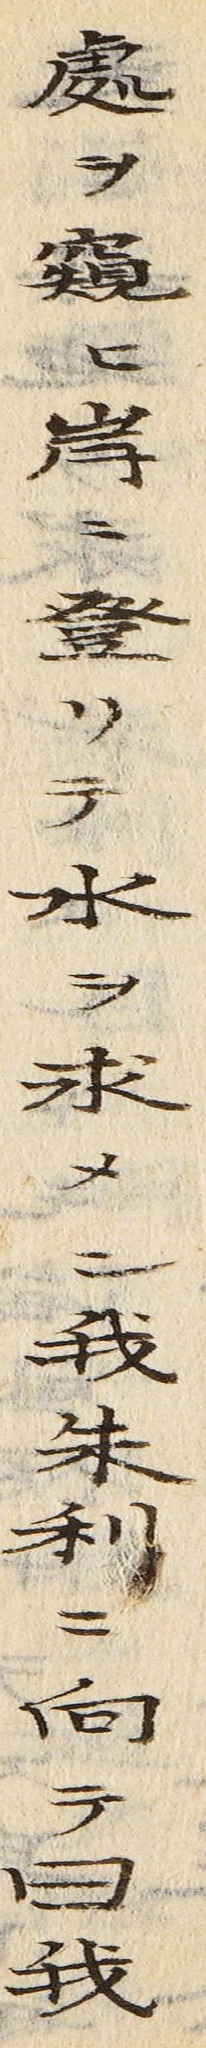処ヲ窺ヒ岸ニ登リテ水ヲ求メン我朱利ニ向テ曰我
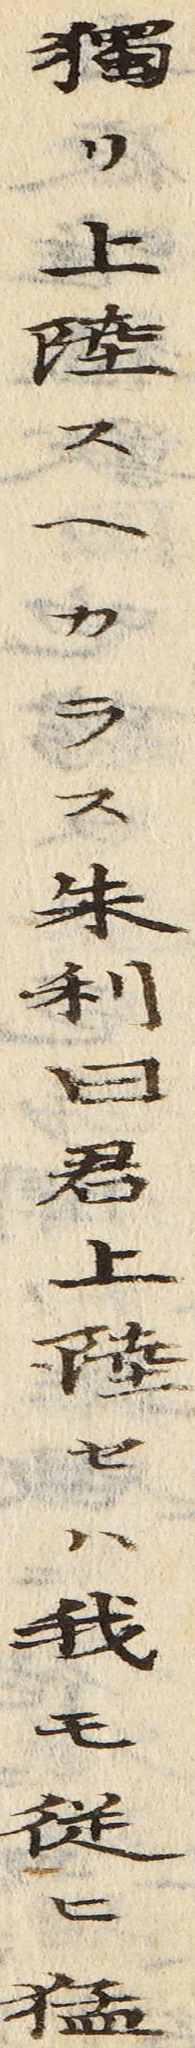独リ上陸スヘカラス朱利曰君上陸セハ我モ従ヒ猛
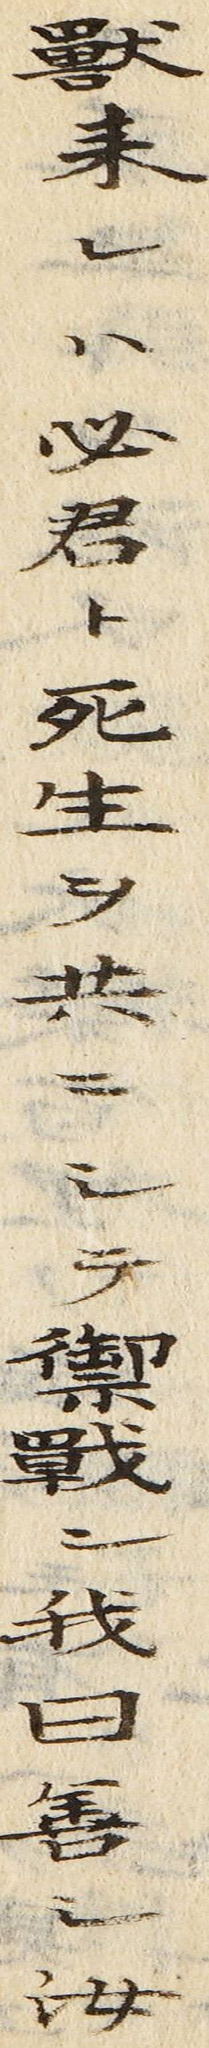獣来レハ必君ト死生ヲ共ニシテ禦戦ン我曰善シ汝
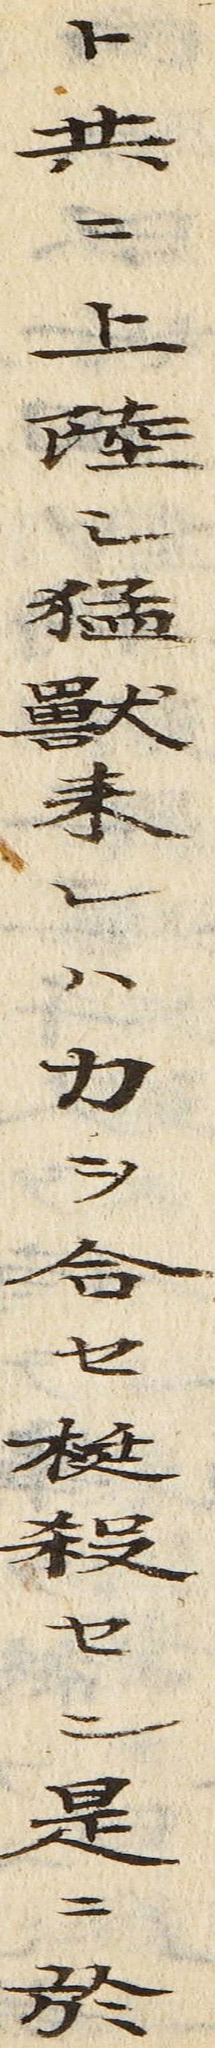ト共ニ上陸シ猛獣来レハ力ヲ合セ梴殺セン是ニ於
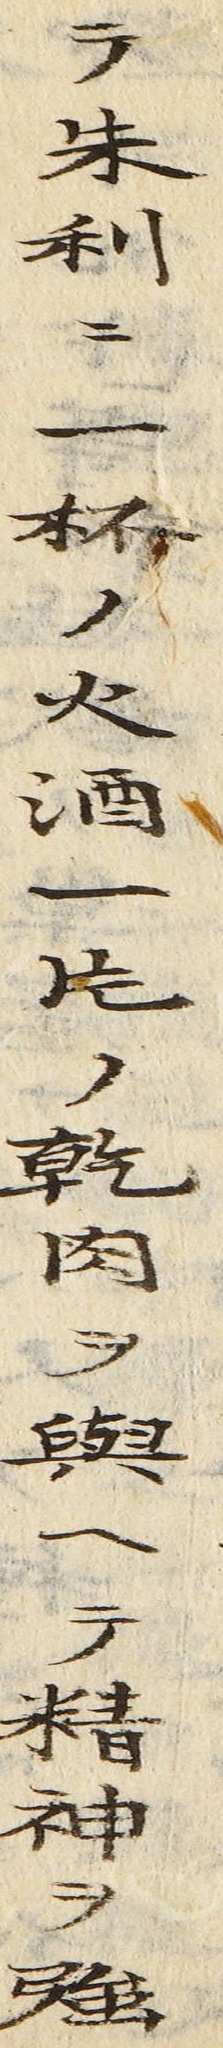テ朱利ニ一杯ノ火酒一片ノ乾肉ヲ与ヘテ精神ヲ強
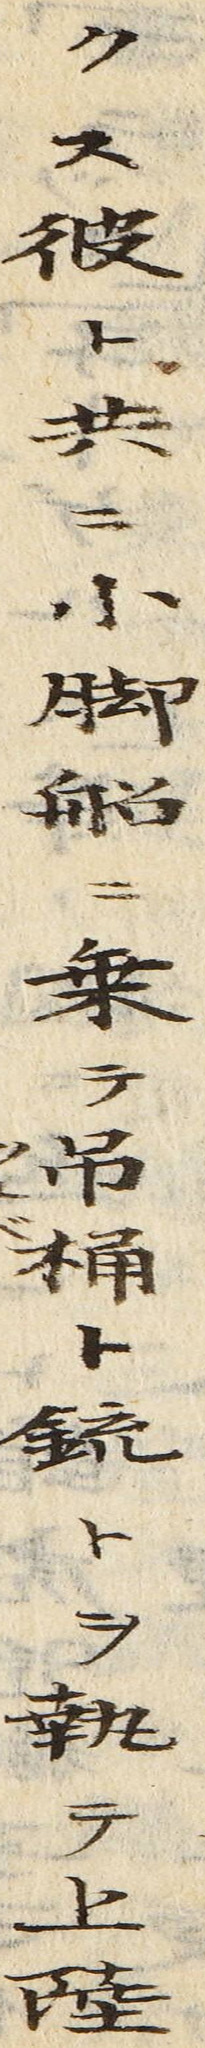クス彼ト共ニ小脚船ニ乗テ吊桶ト銃トヲ執テ上陸
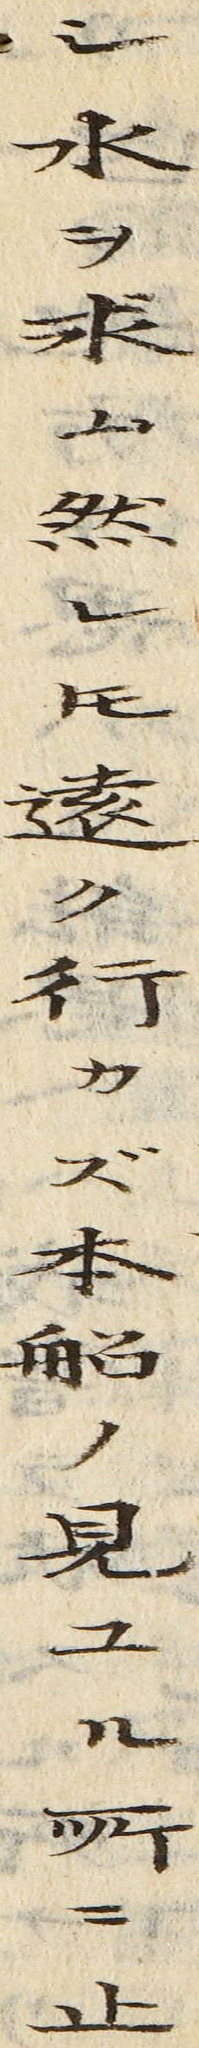シ水ヲ求ム然レトモ遠ク行カズ本船ノ見ユル所ニ止
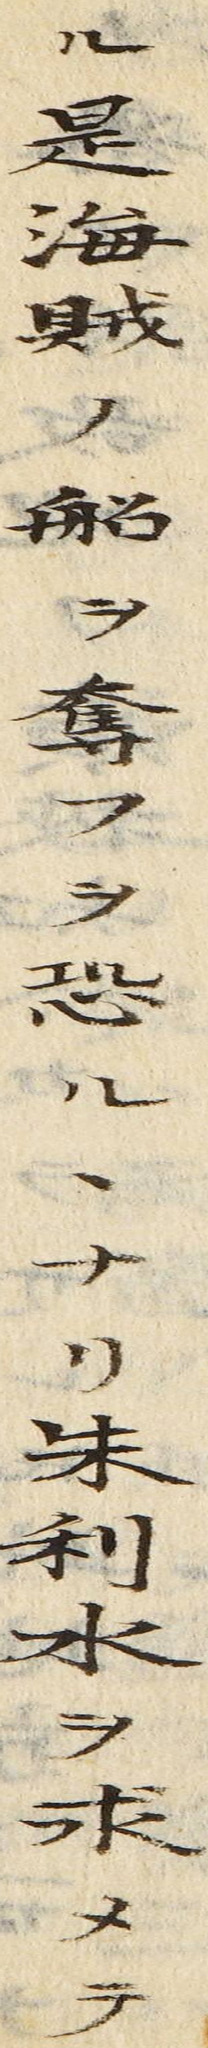ル是海賊ノ船ヲ奪フヲ恐ルヽナリ朱利水ヲ求メテ
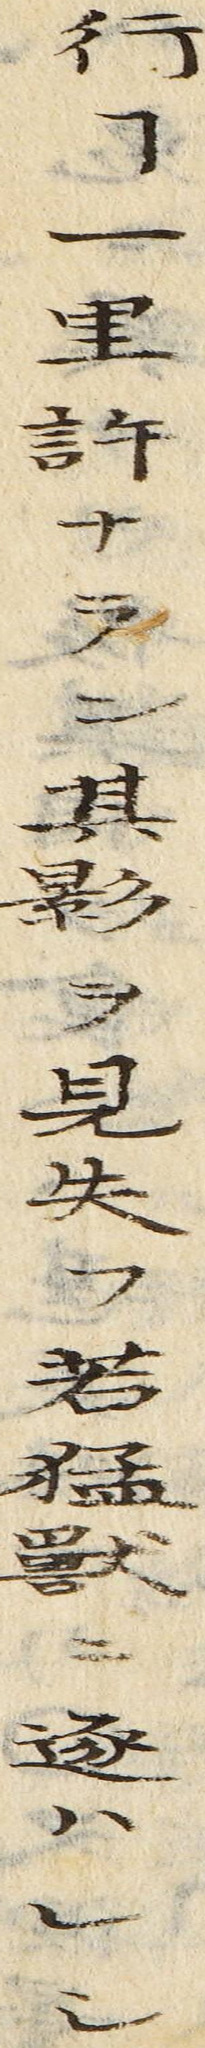行コト一里許ナラン其影ヲ見失フ若猛獣ニ逐ハレシ
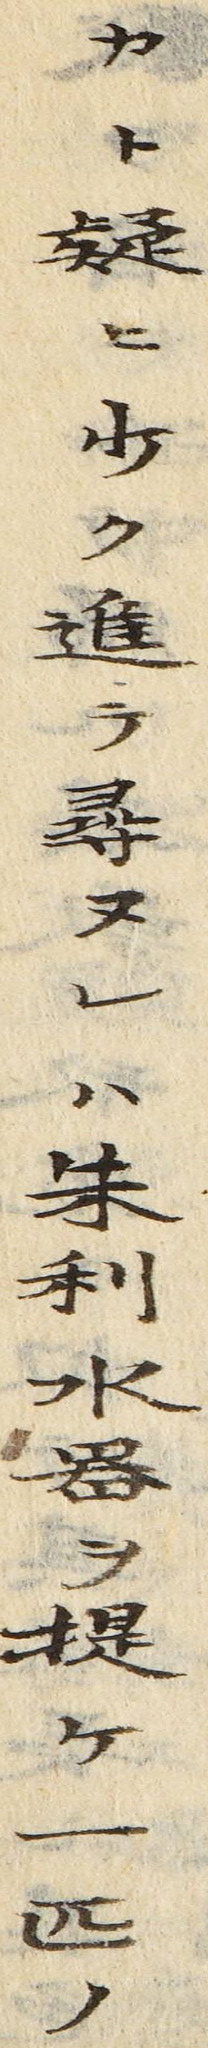カト疑ヒ少ク進テ尋ヌレハ朱利水器ヲ提ケ一匹ノ

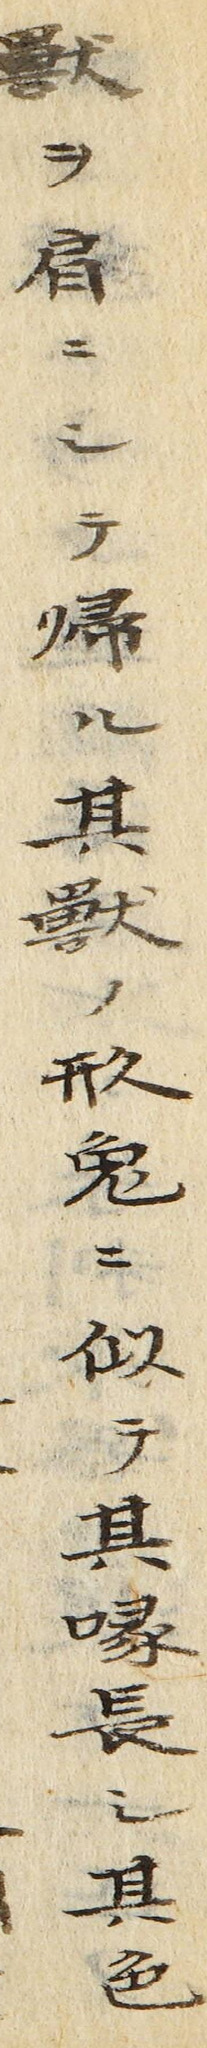獣ヲ肩ニシテ帰ル其獣ノ形兎ニ似テ其喙長シ其色
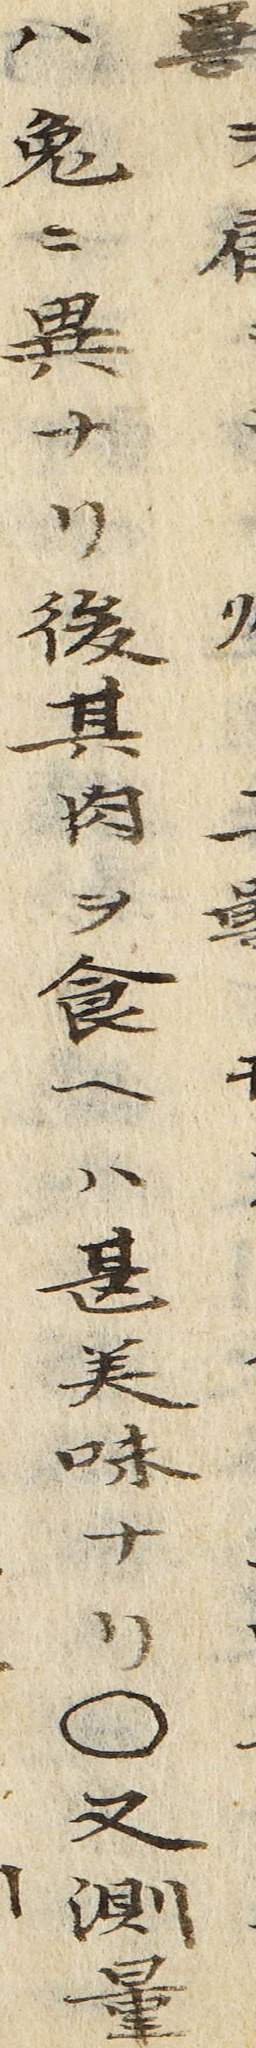ハ兎ニ異ナリ後其肉ヲ食ヘハ甚美味ナリ◯又測量
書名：漂流紀事
